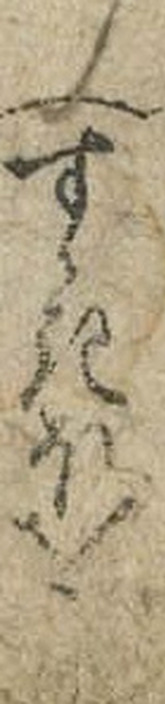すゝきほを
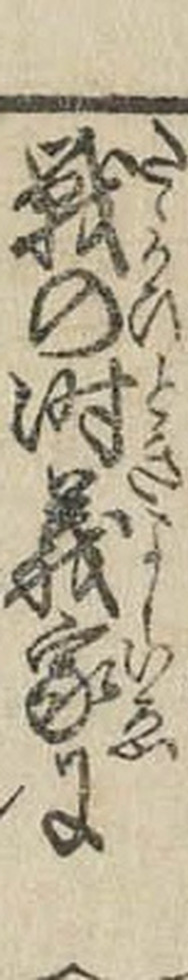戦の時義家に
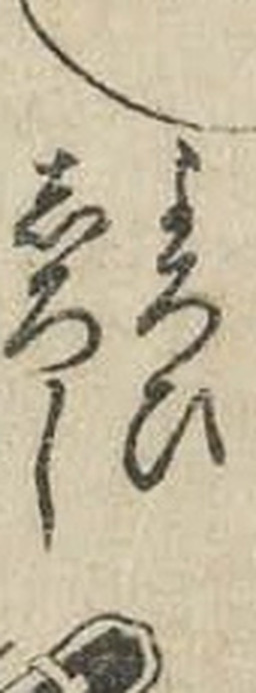しろし
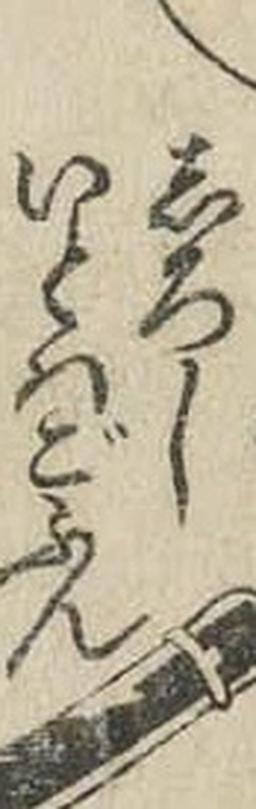いとはごふん
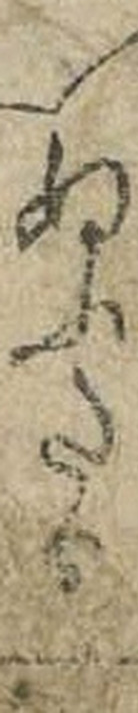ぬふたる
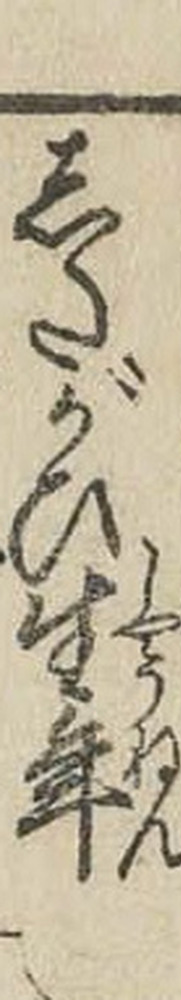したがひ生年
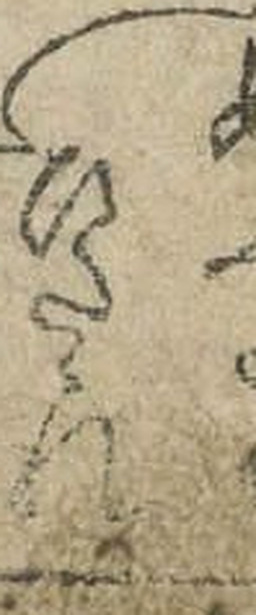ひたゝれ
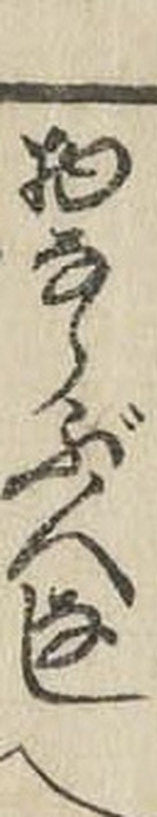物ならぶ人なし
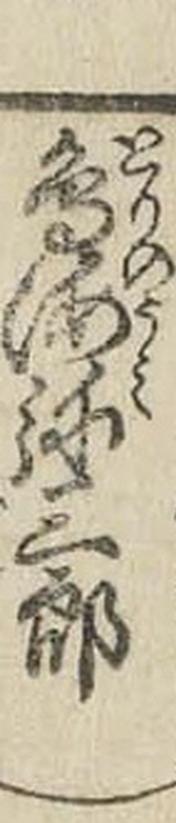鳥海弥三郎
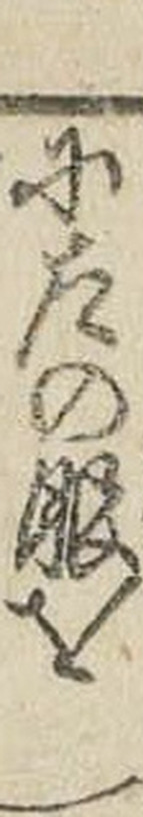に左の眼を
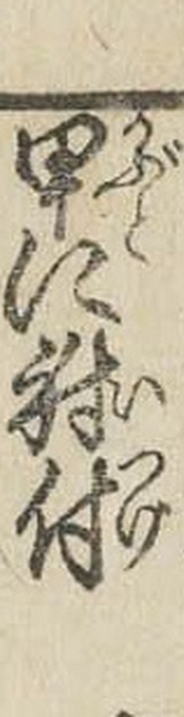甲に射付
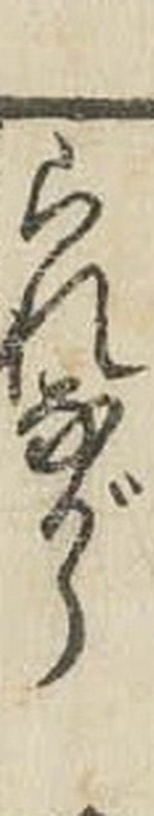られながら
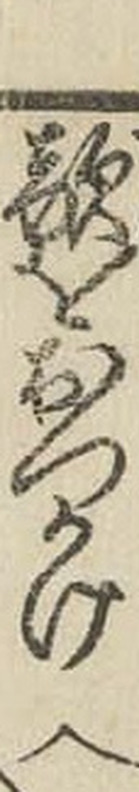敵をおつかけ
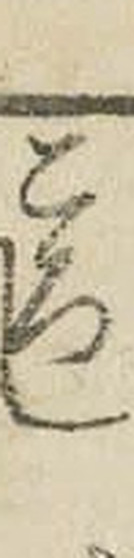ころし
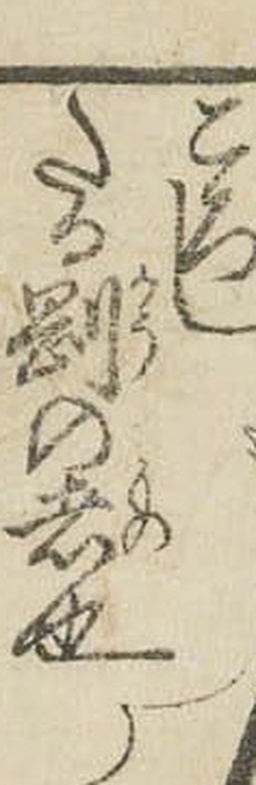たる剛の者也
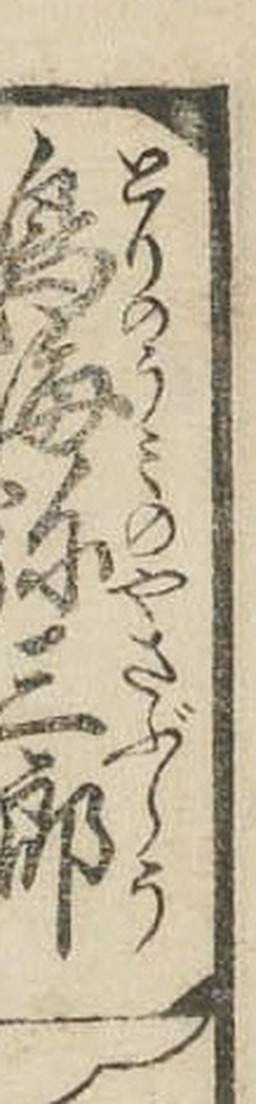鳥海弥三郎
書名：絵本写宝袋 9巻 3之巻
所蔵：東京学芸大学教育コンテンツアーカイブ
